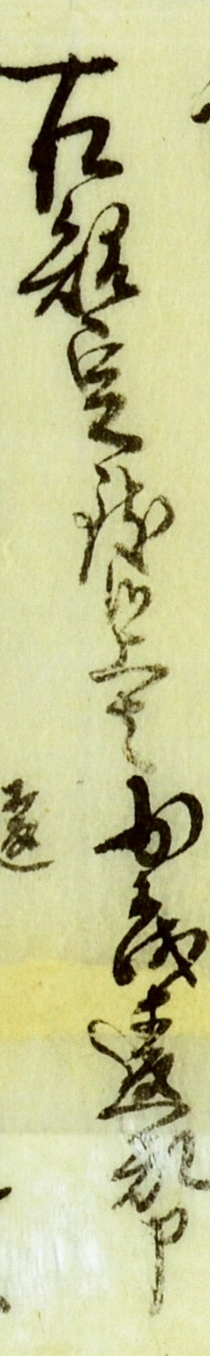右規定致候上者少茂違乱申

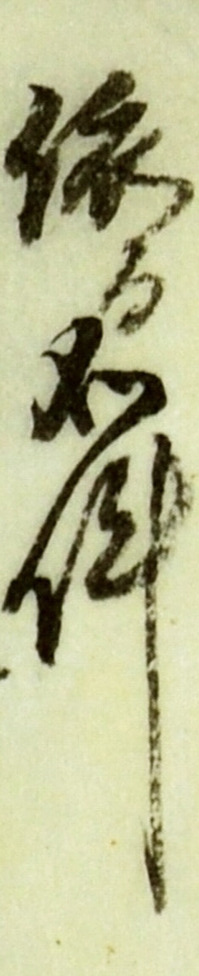依而如件
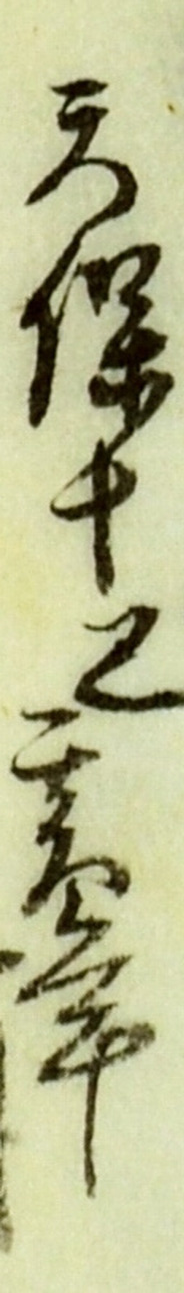天保十巳亥年
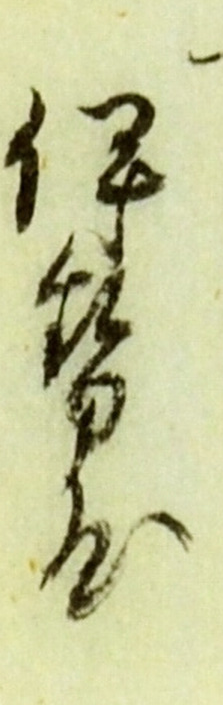伊勢屋
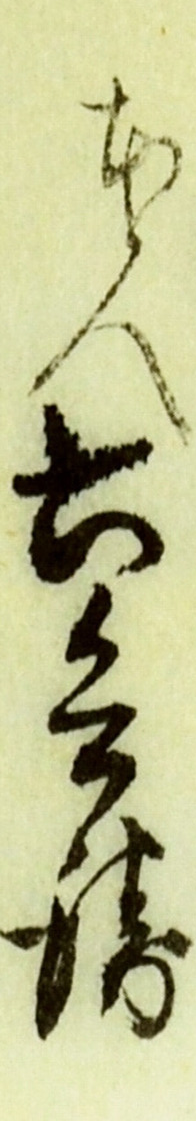本人六兵衛
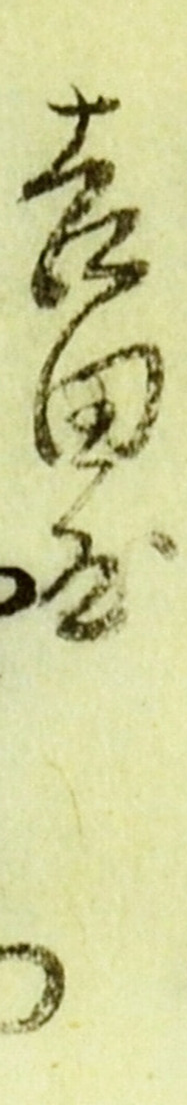吉田屋
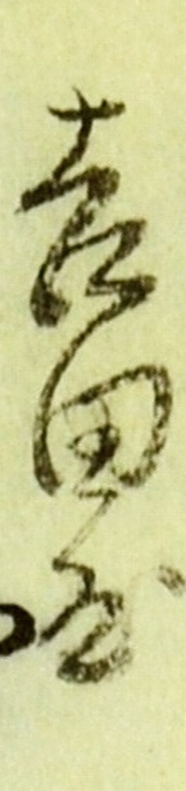吉田屋
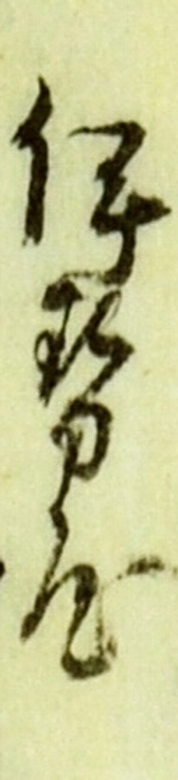伊勢屋
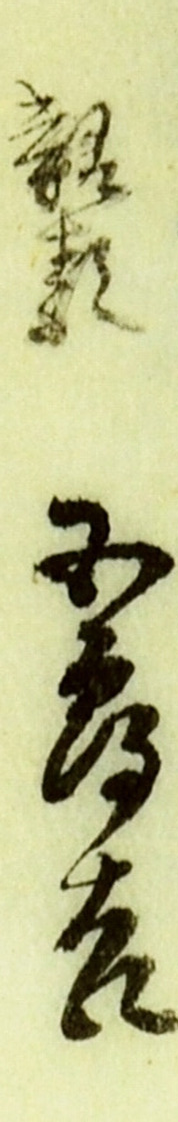親類五郎吉
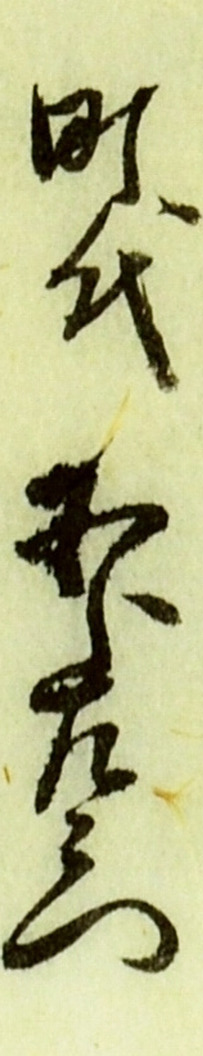町代五郎左衛門
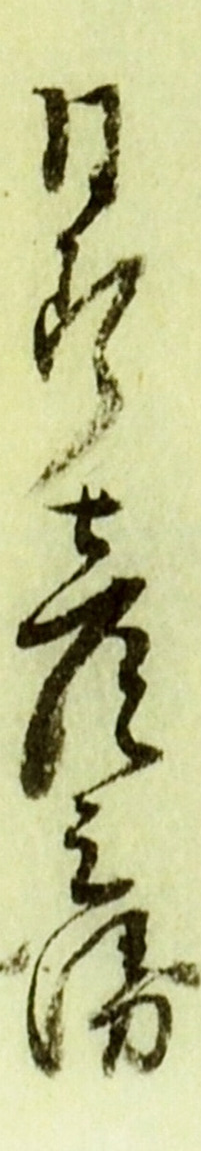同断彦兵衛
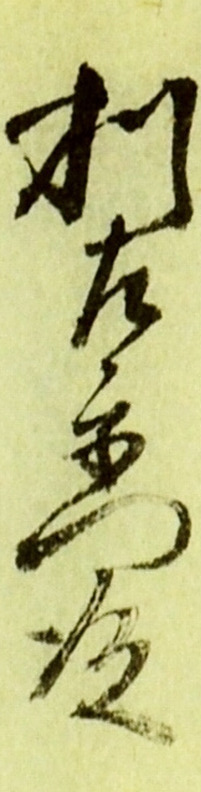利左衛門殿
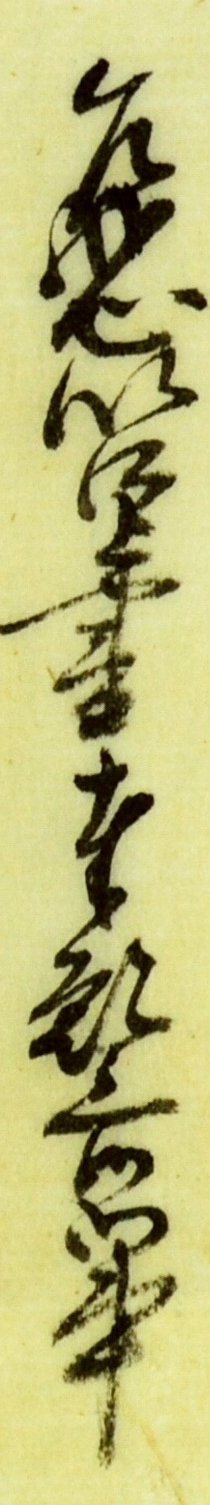乍恐以口上書奉願上候御事
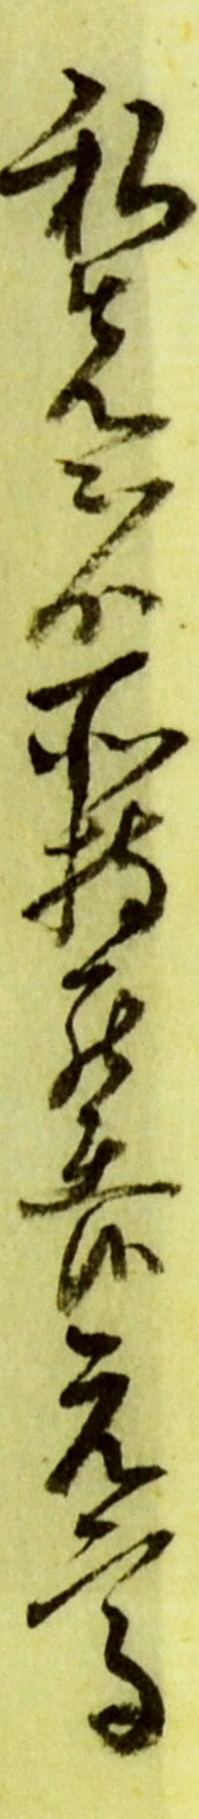私先々ゟ所持罷存候元高
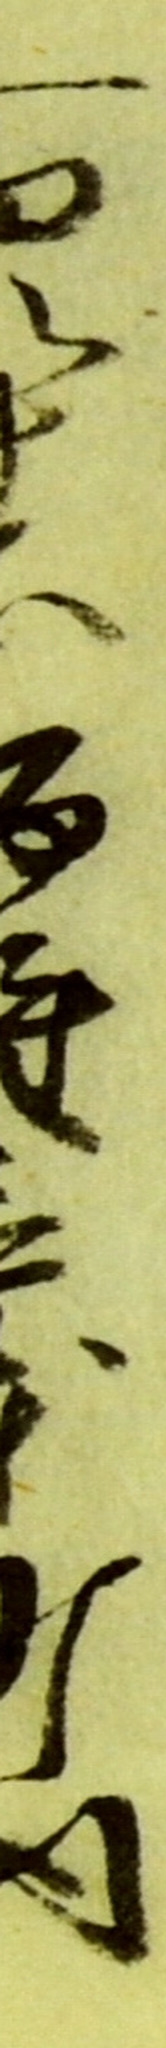百八十石酒株壱本町内

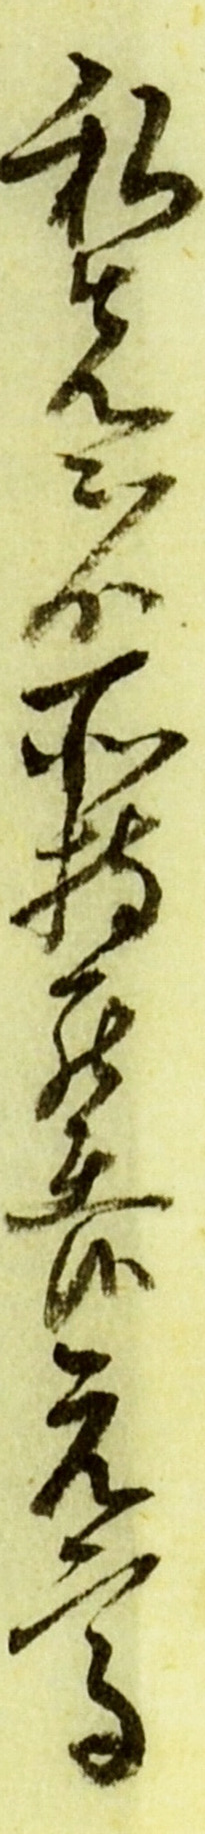私先々ゟ所持罷存候元高
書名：造酒株一件始末
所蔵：伊那市立高遠町図書館・合同会社AMANE
